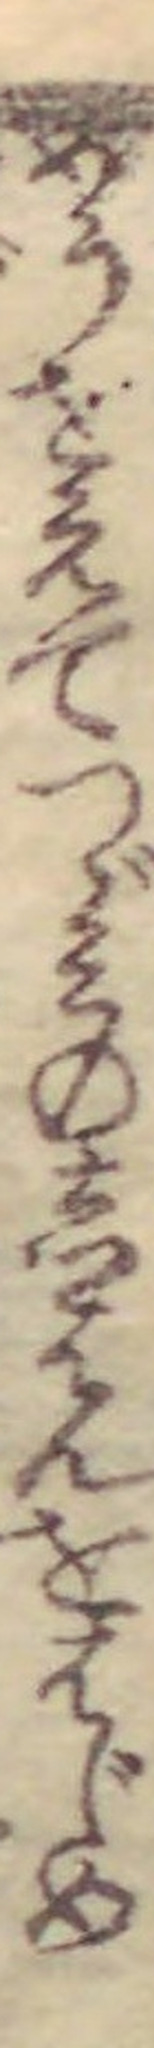めうをえてつゞみのしはんをはじめ
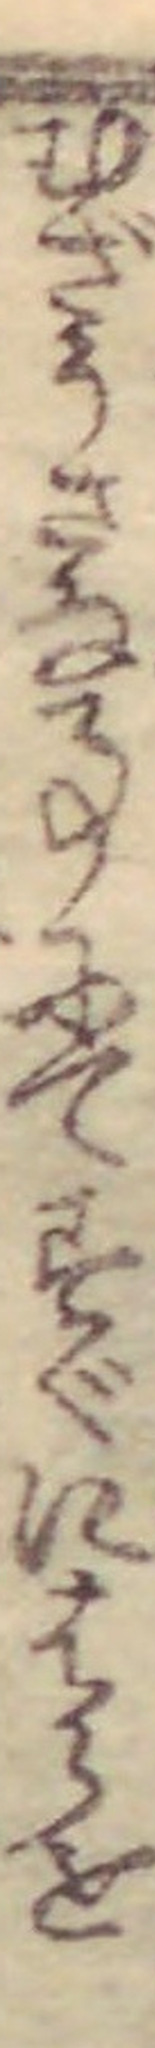むざうさな事にてすぐにはらを
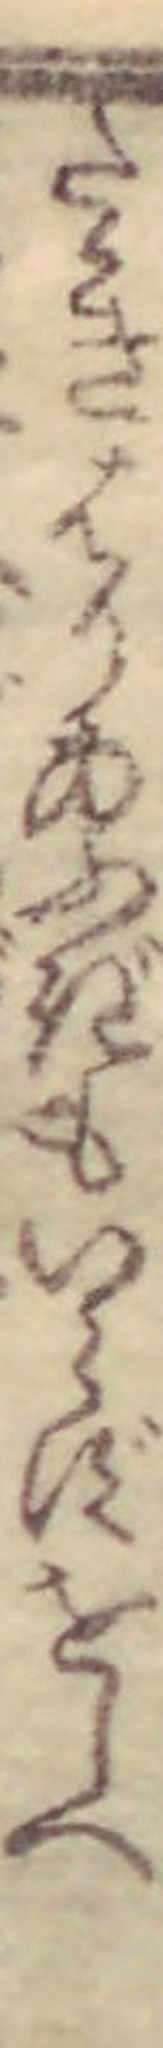たゝきはりあふぎもいらずをしへ
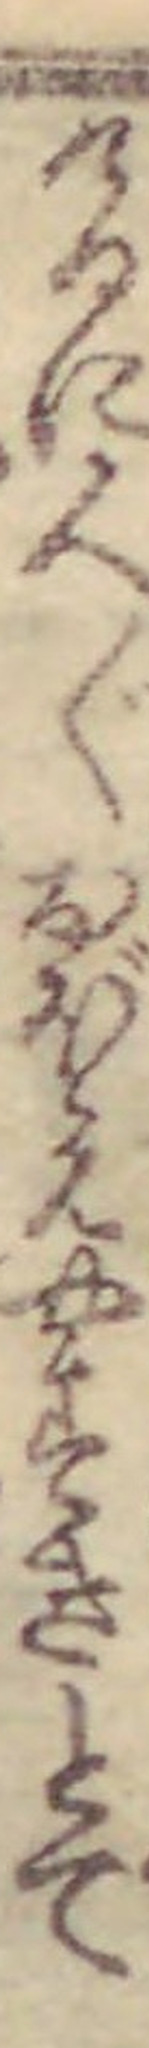けるに人〴〵おぼえやすきとて
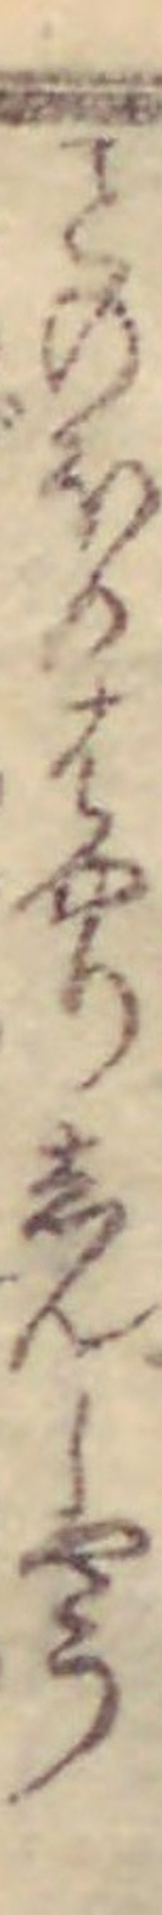ことのほかはやりしんしやう
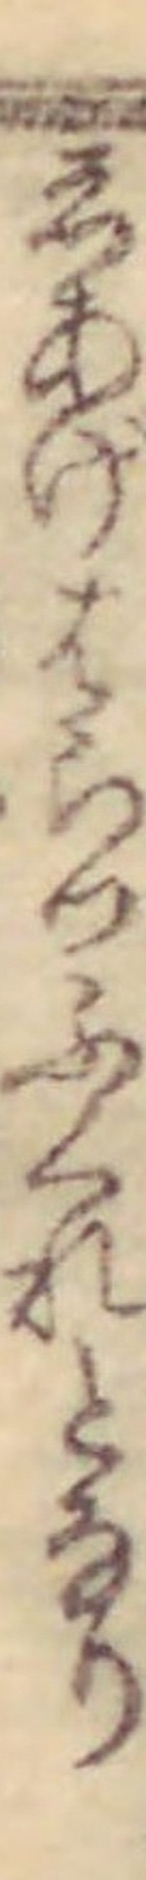ゑあげはらつふくれとなり
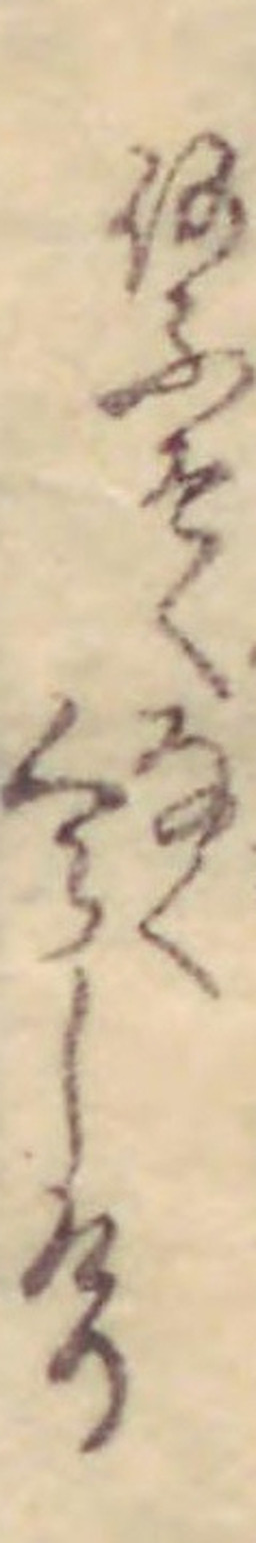くらしけり
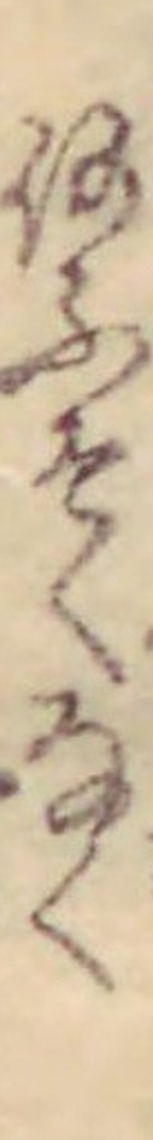何ふそくなく
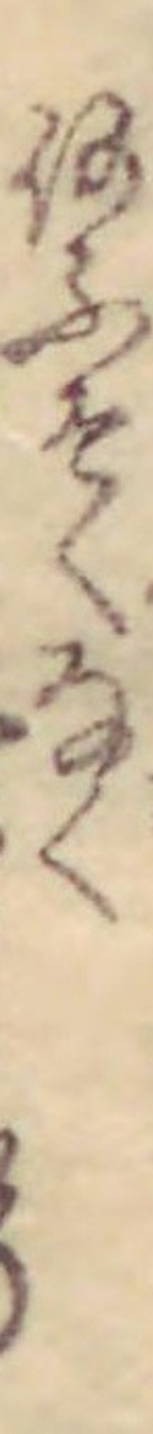何ふそくなく
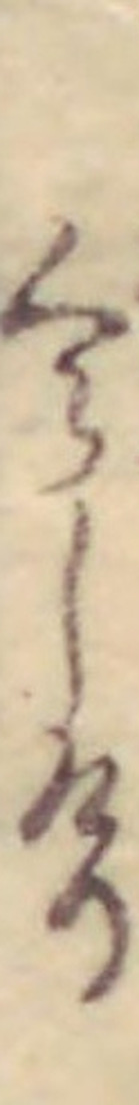くらしけり
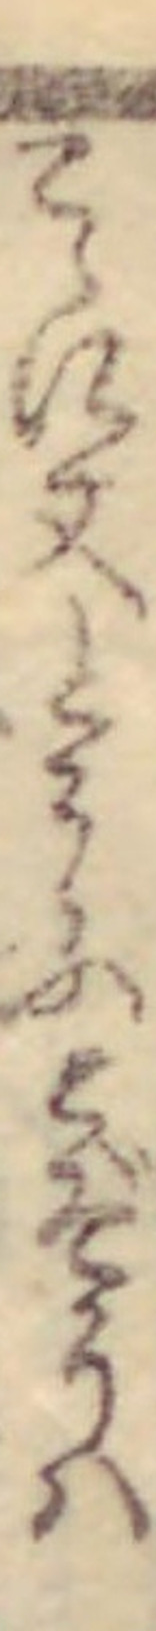こゝに又とうふこぞうは
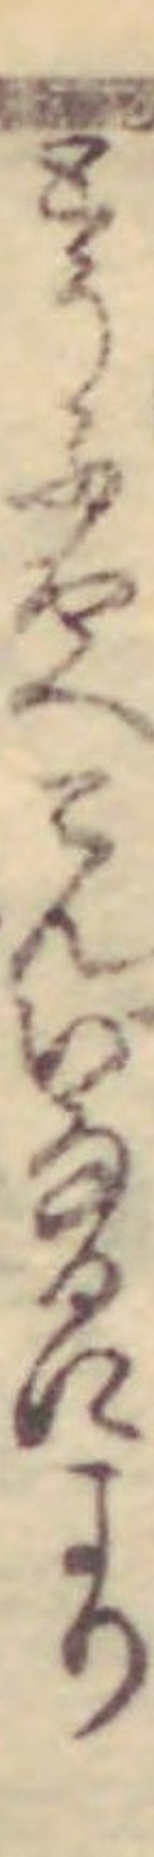とうふやへこんいなるにより
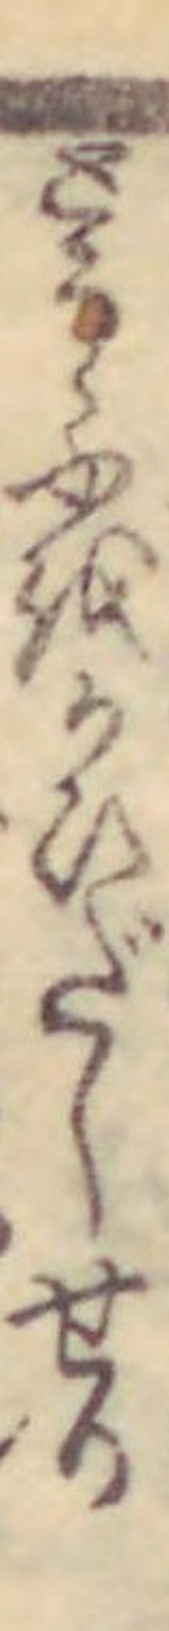とうふをかいだしせり
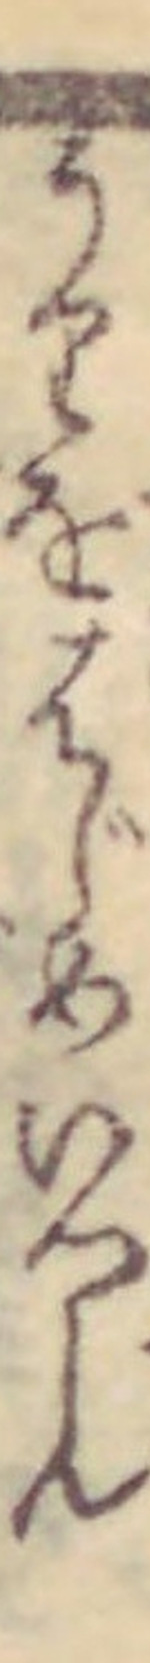うりをはじめいつしん
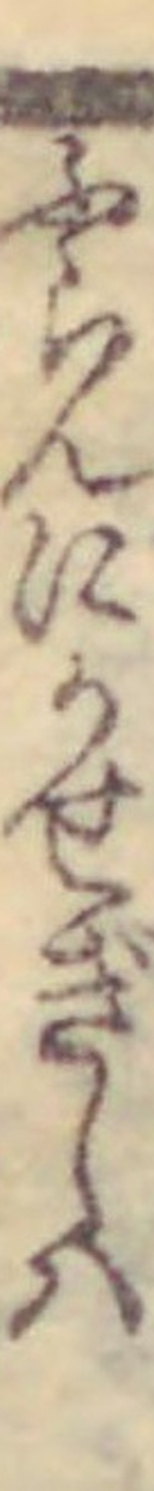ふらんにかせぎしは
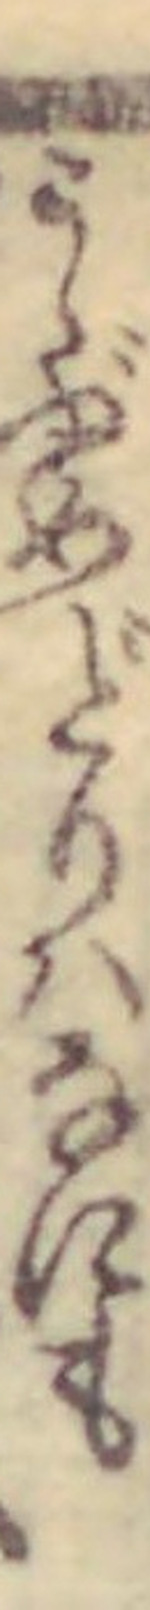うぶめどりはなにも
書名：化物世帯氣質
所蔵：国立国会図書館 National Diet Library, JAPAN
